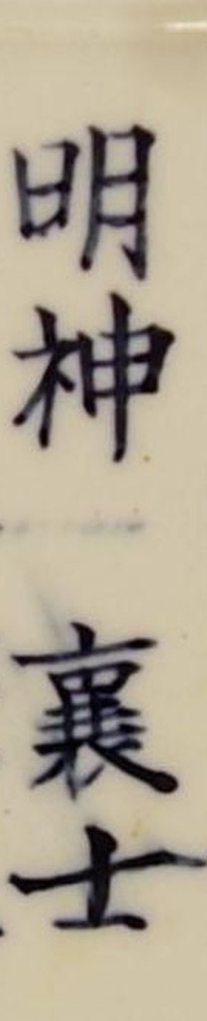明神襄士
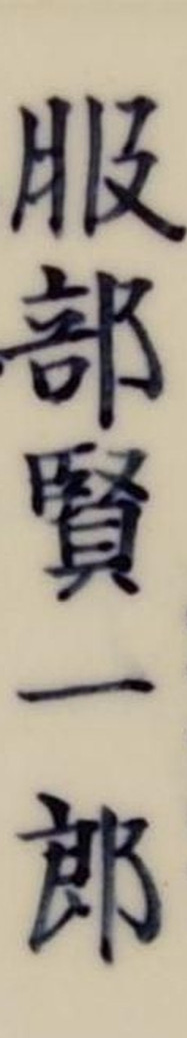服部賢一郎
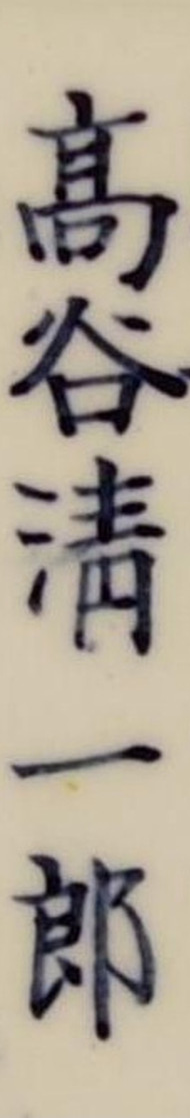高谷清一郎
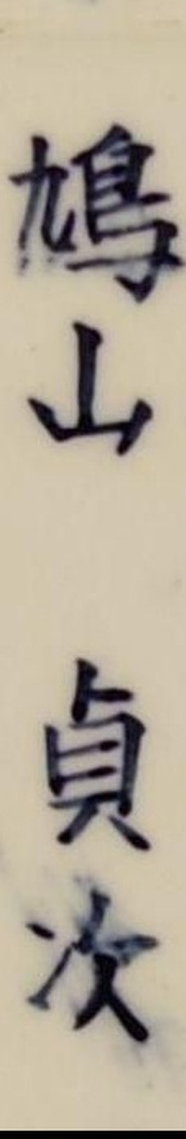鳩山貞次
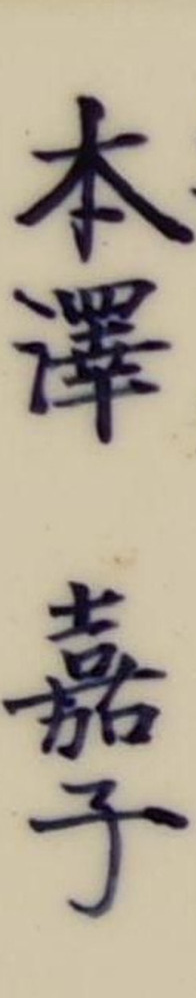本澤嘉子
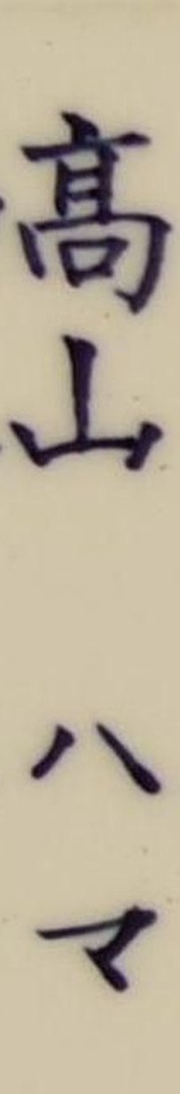高山ハマ
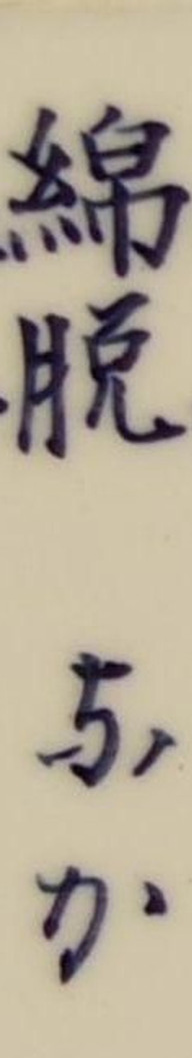綿脱なか
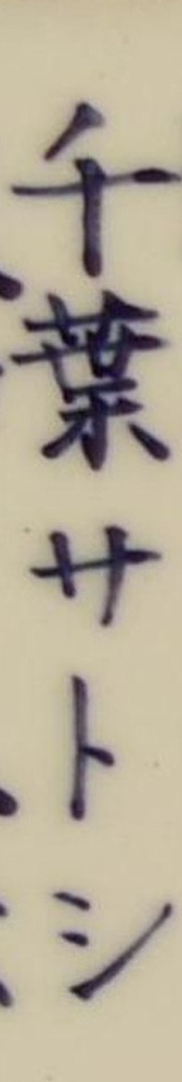千葉サトシ
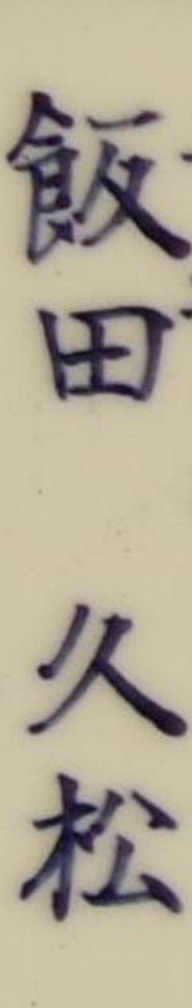飯田久松

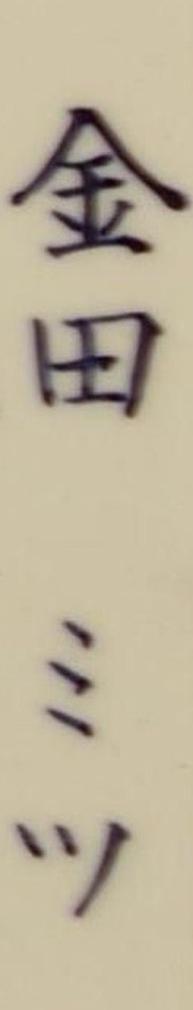金田ミツ
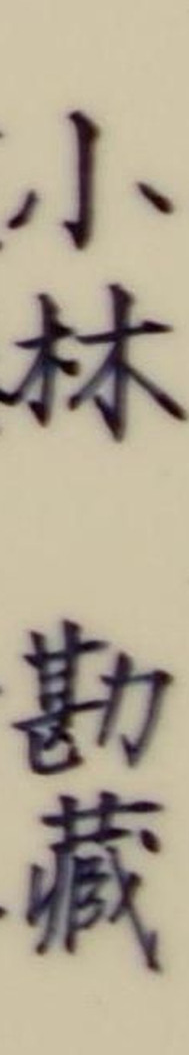小林勘蔵
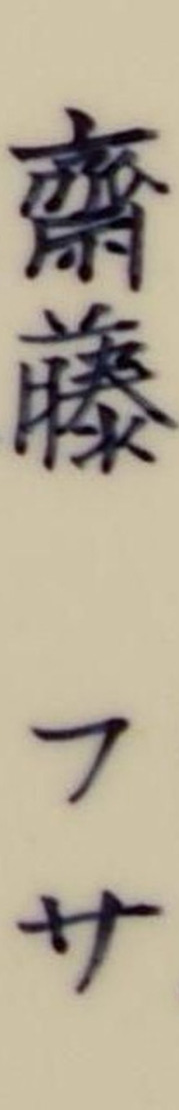斎藤フサ
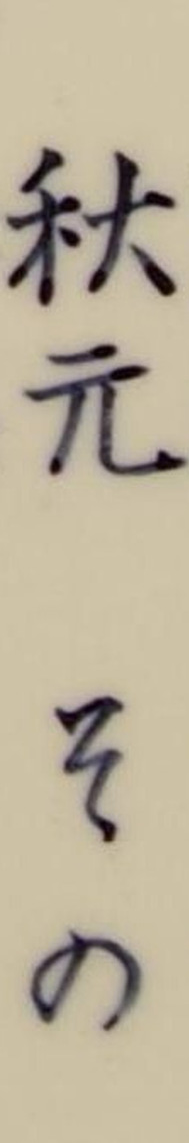秋元その
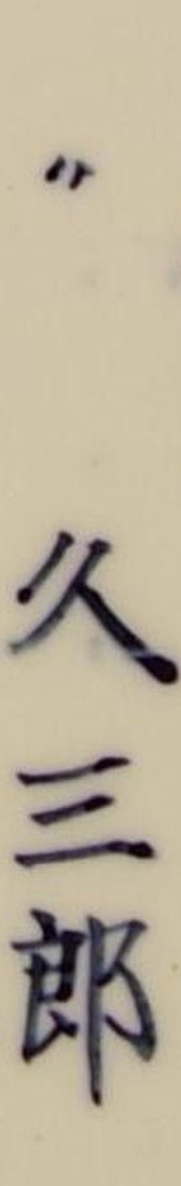久三郎
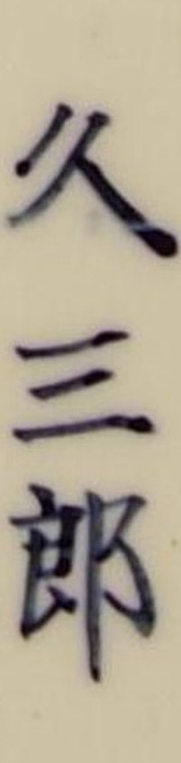久三郎
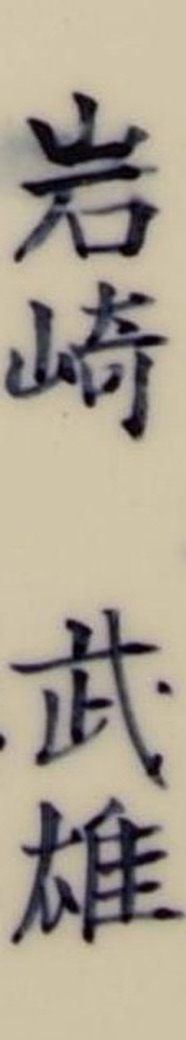岩崎武雄
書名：E~L
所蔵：高野山金剛峯寺
